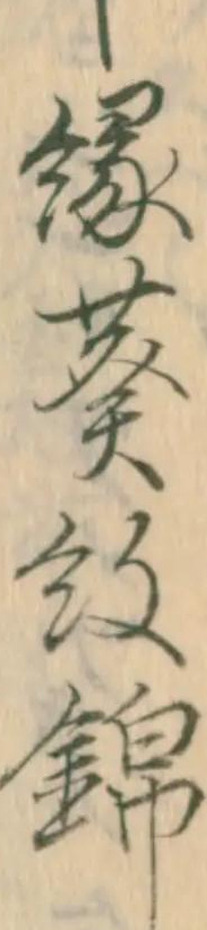縁葵紋錦
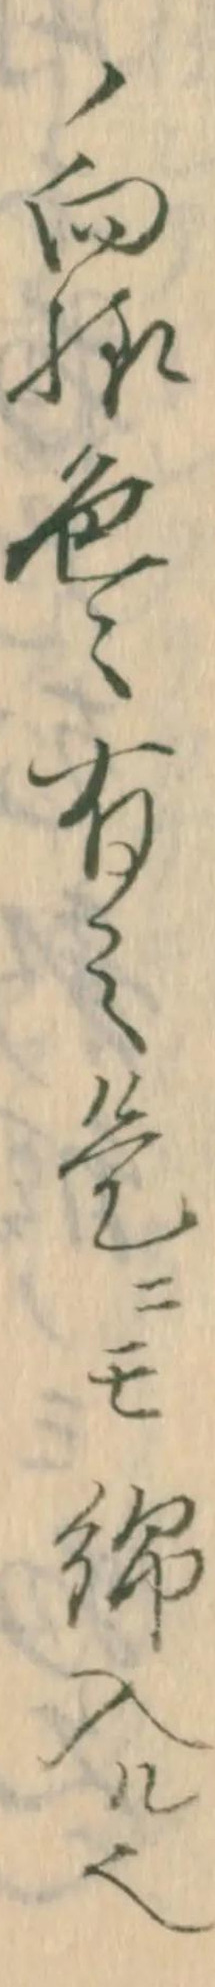ノ向様色々有之是ニモ綿入ル也
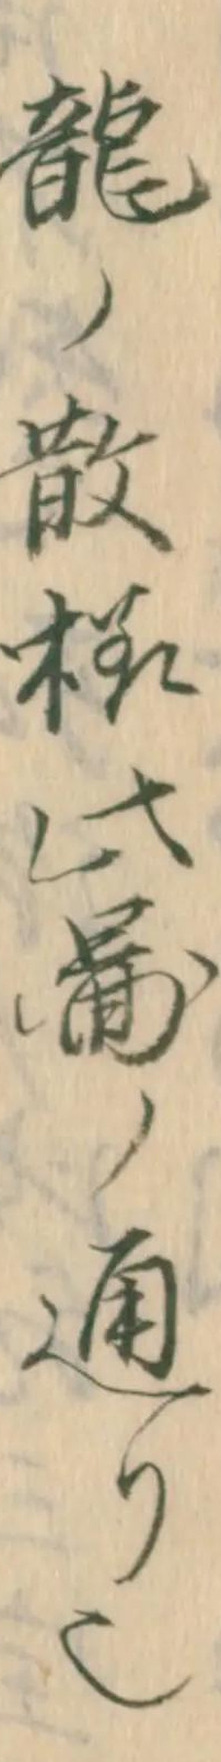龍ノ散様此図ノ通リ也
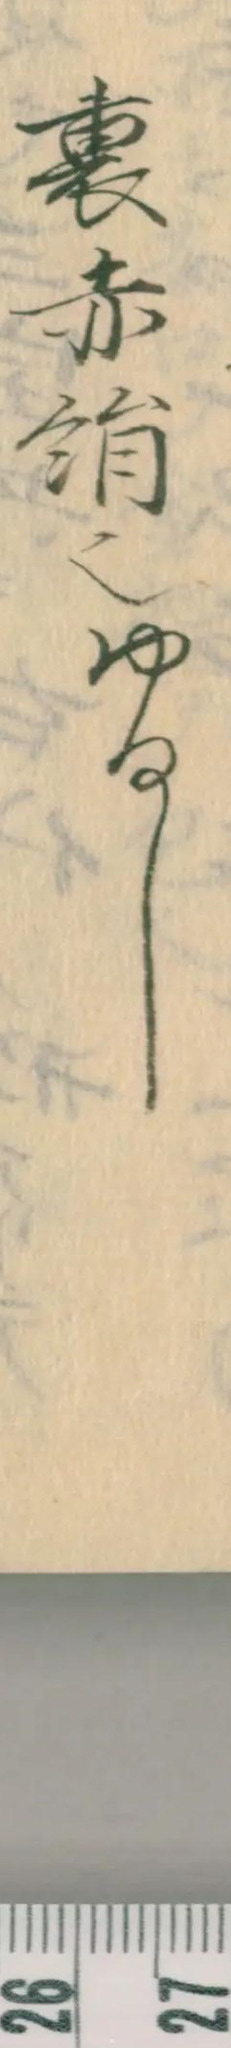裏赤絹也ゆるし
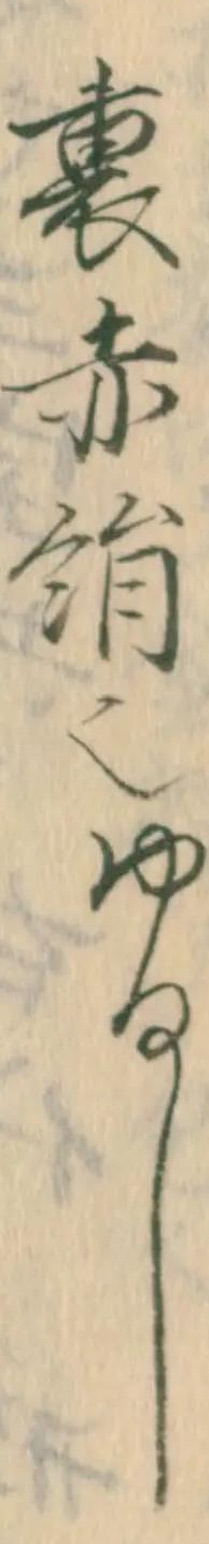裏赤絹也ゆるし
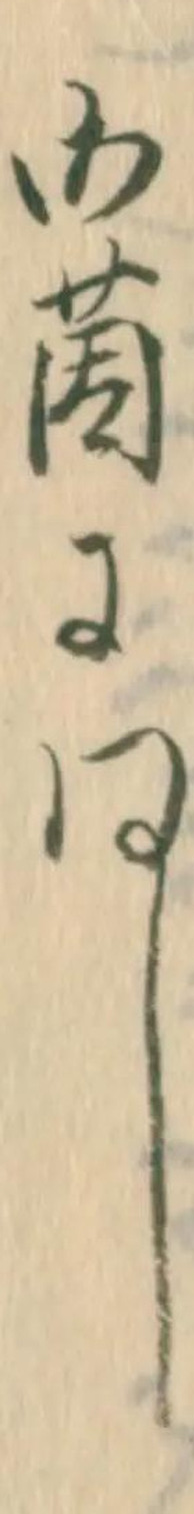御茵に同し
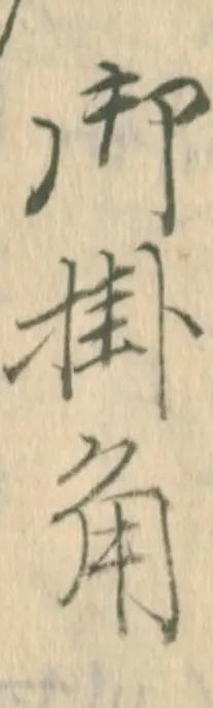御掛角

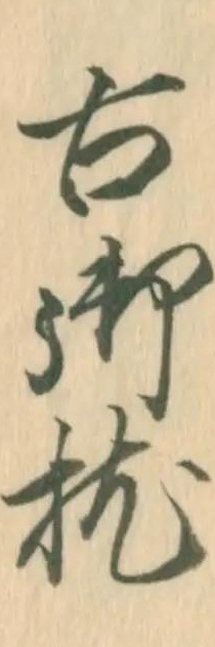古御枕
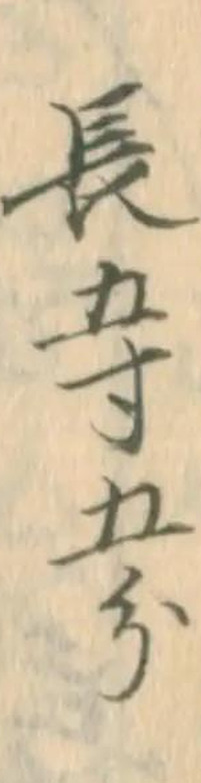長五寸五分
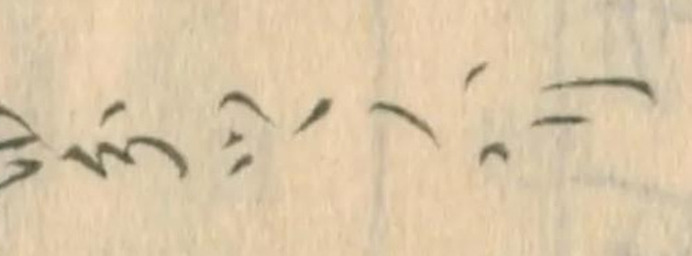但弐分ツヽノハリ
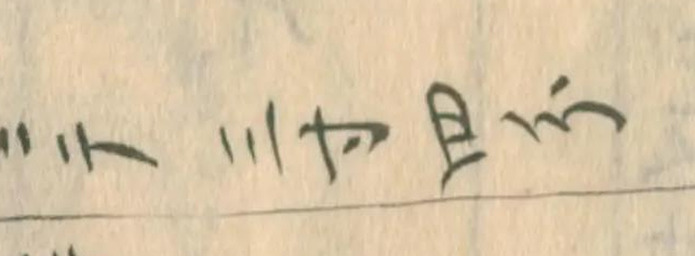中ニテ三寸四分
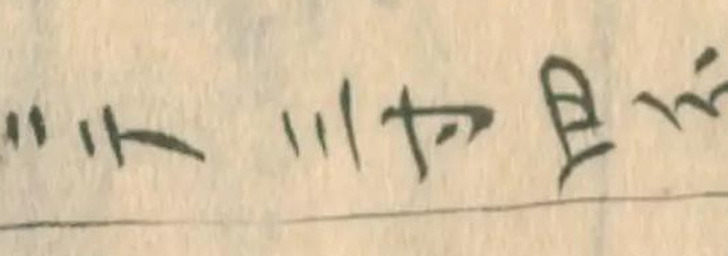中ニテ三寸四分
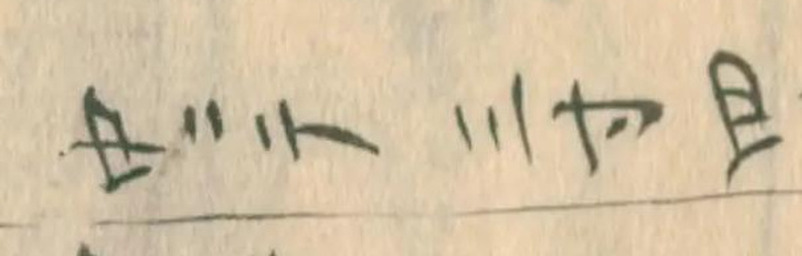中ニテ三寸四分
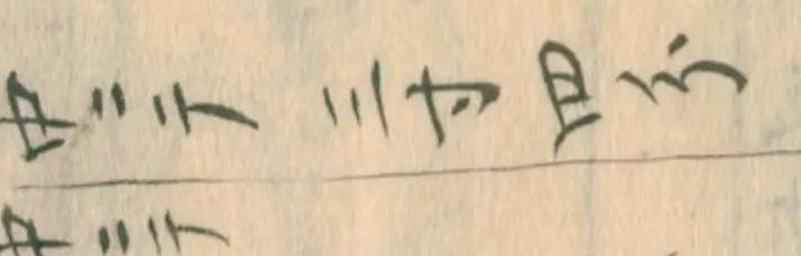中ニテ三寸四分
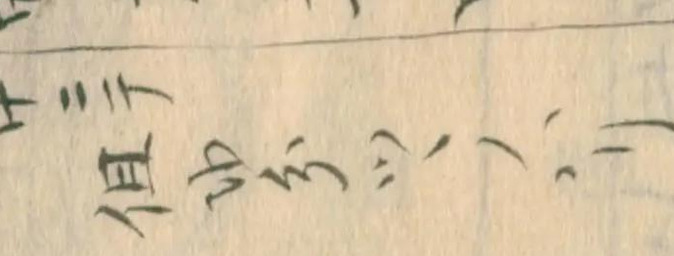但弐分ツヽノハリ
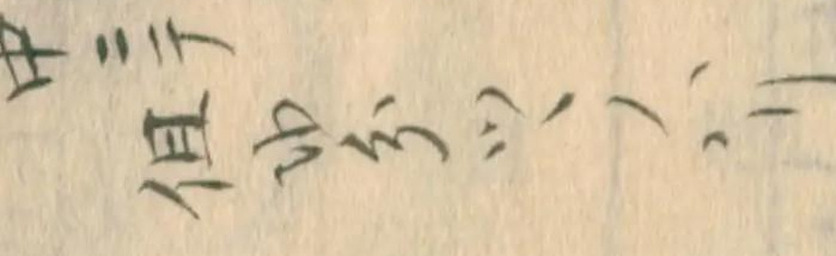但弐分ツヽノハリ
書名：賀茂社記録. 第15冊
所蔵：国立国会図書館 National Diet Library, JAPAN
